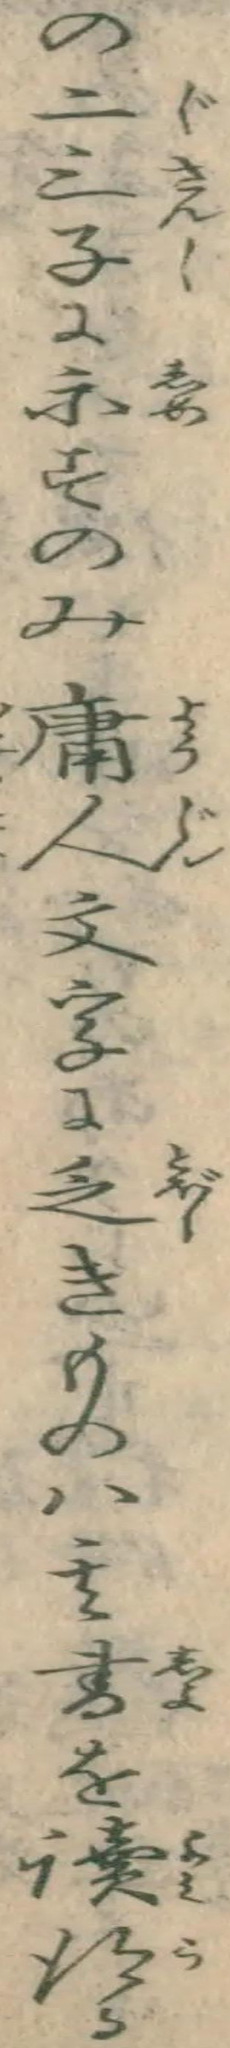の二三子に示すのみ庸人文字に乏きｍのは其書を読得る
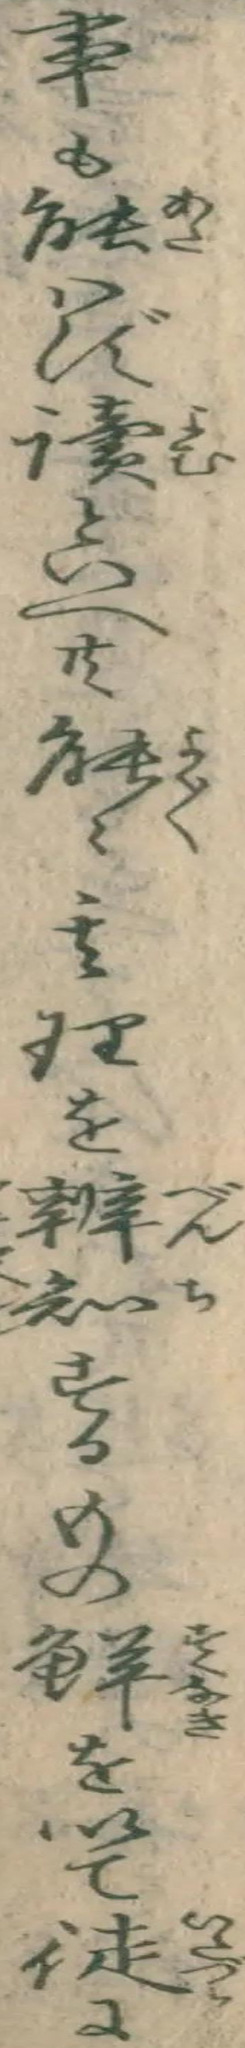事も能はず読といへ其能々其を辨知するもの觧を以て徒に

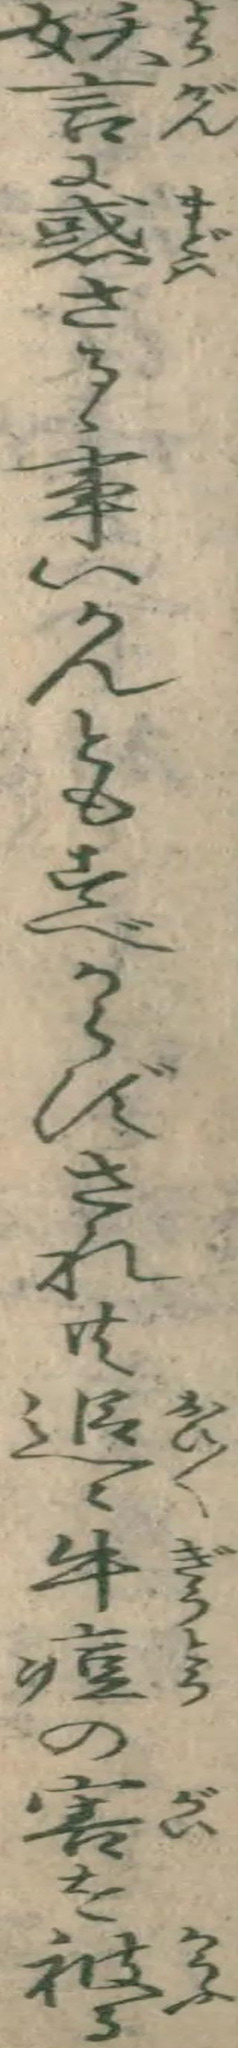妖言に惑さるゝ事いかんともすべからずされ其追々牛痘の害を被る
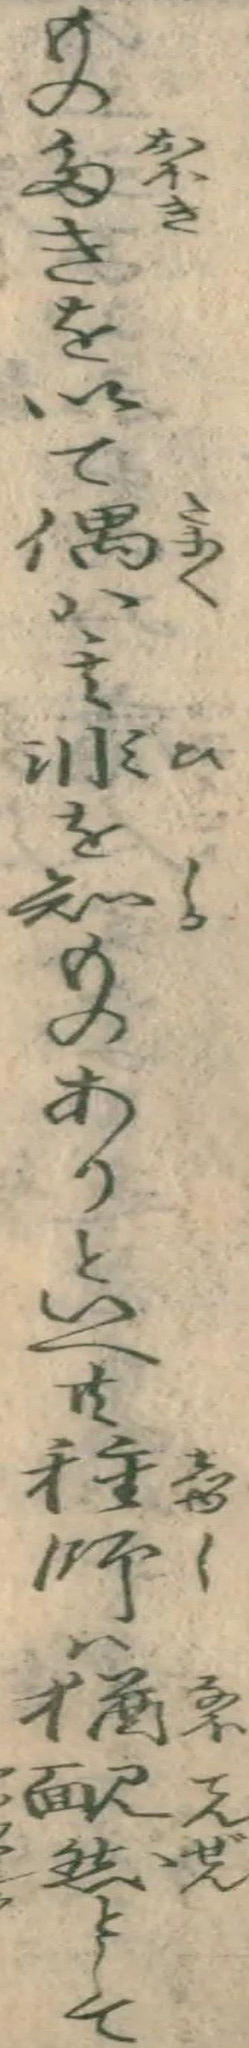もの多きを以て隅々は其非を知ものありといへ其種師は猶靦然として
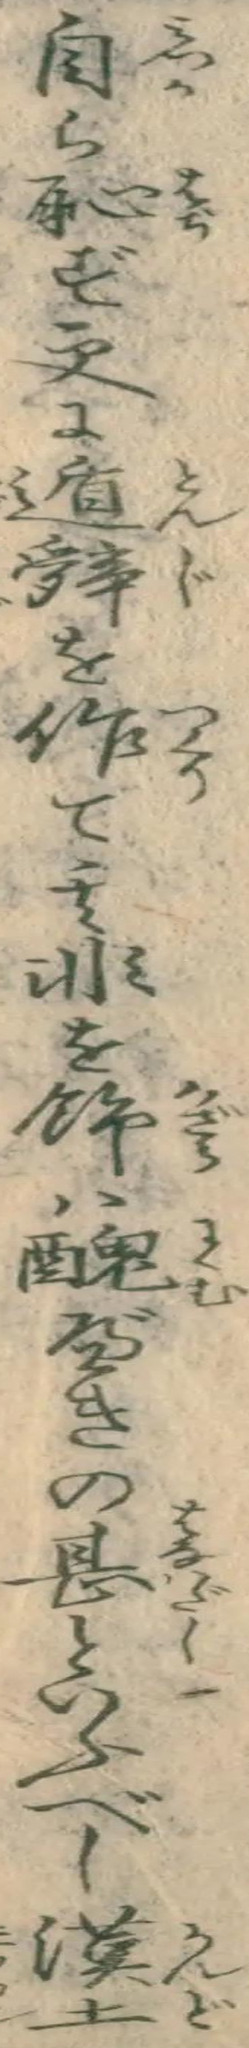自ら恥す更に遁辤を作て其非を飾は醜にべきの甚といふべし漢土
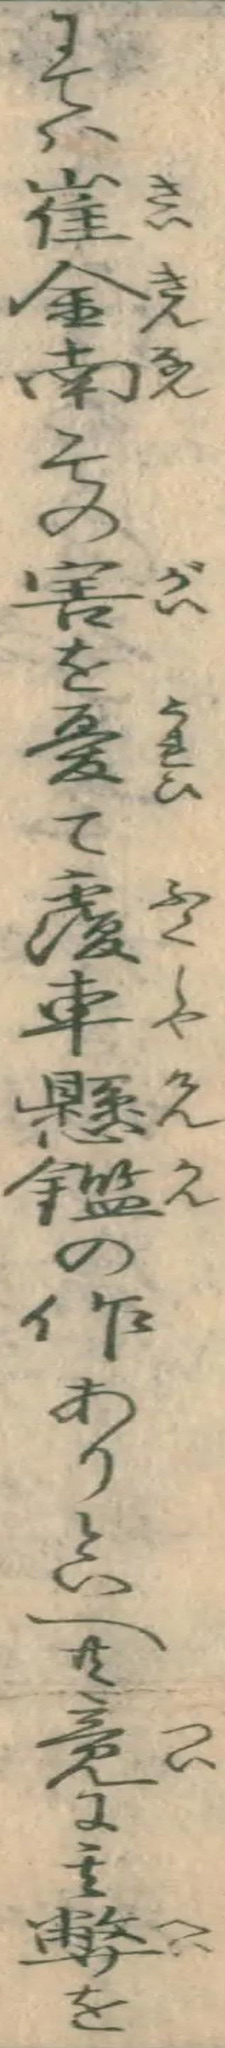にては崔金南その害を憂て覆車懸鑑の作ありといへ其竟に其幣を
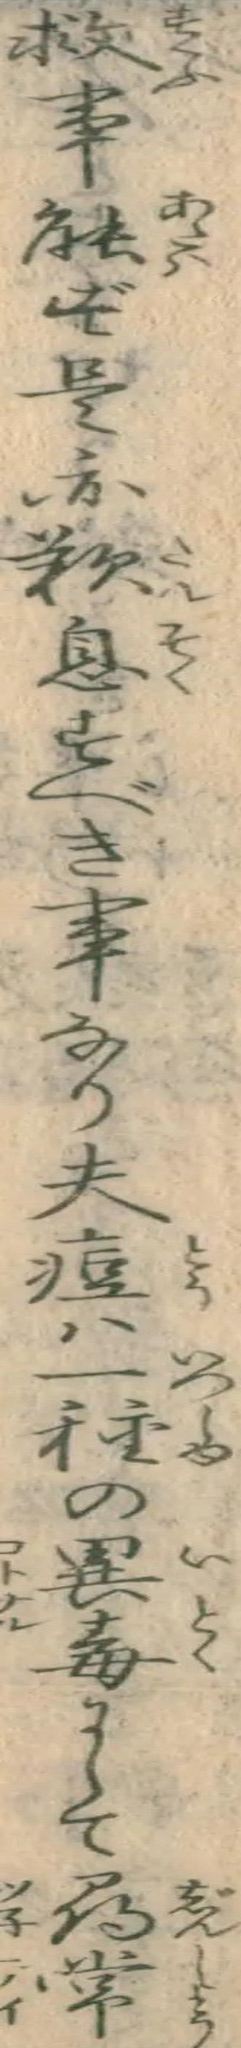救事能ず是亦嘆息すべき事なり夫痘は一種の異毒にして尋常
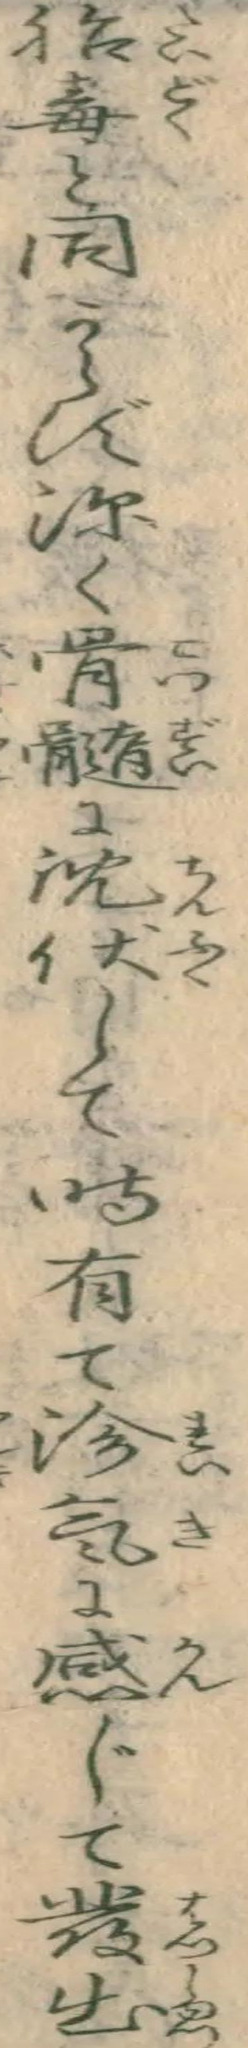毒と同からず深く骨髄に沈伏して時有て沴気に感じて発出
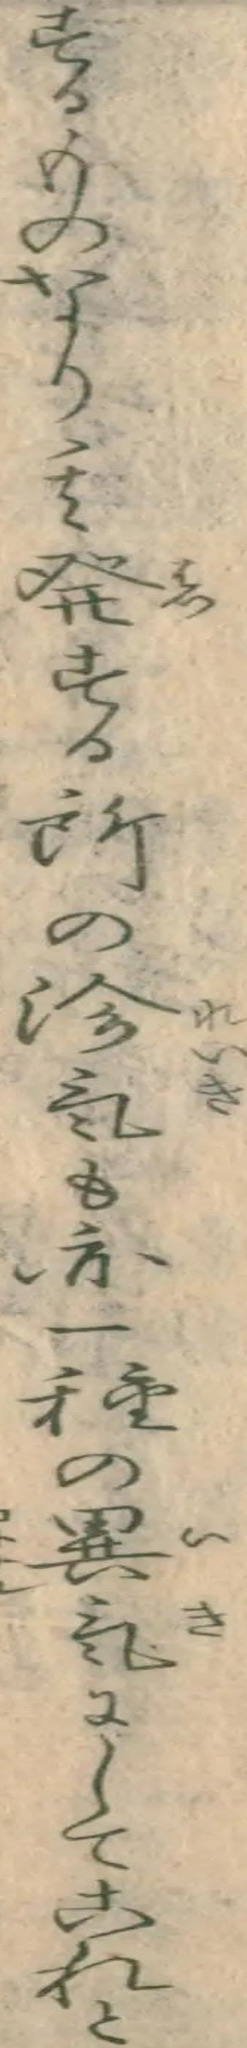するものなり其発する所の沴気も亦一種の異気にしてこれと
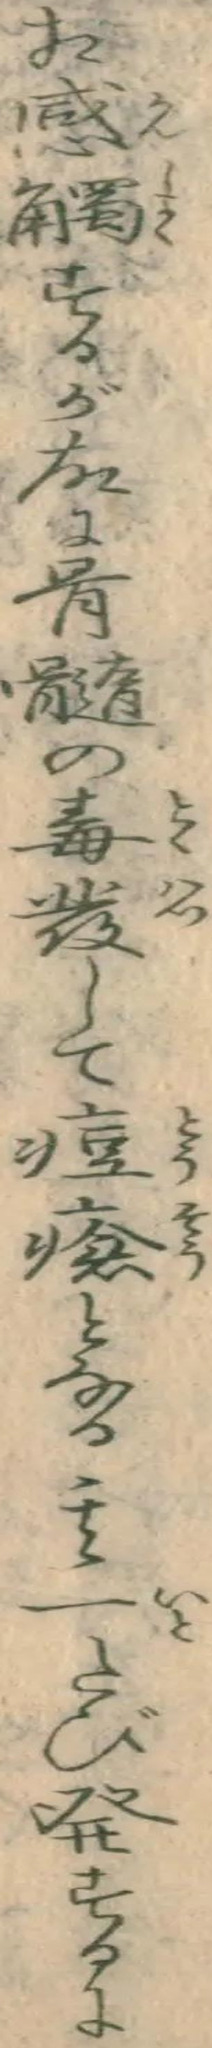相感触するが故に骨髄の毒発して痘瘡となる其一たび発するに
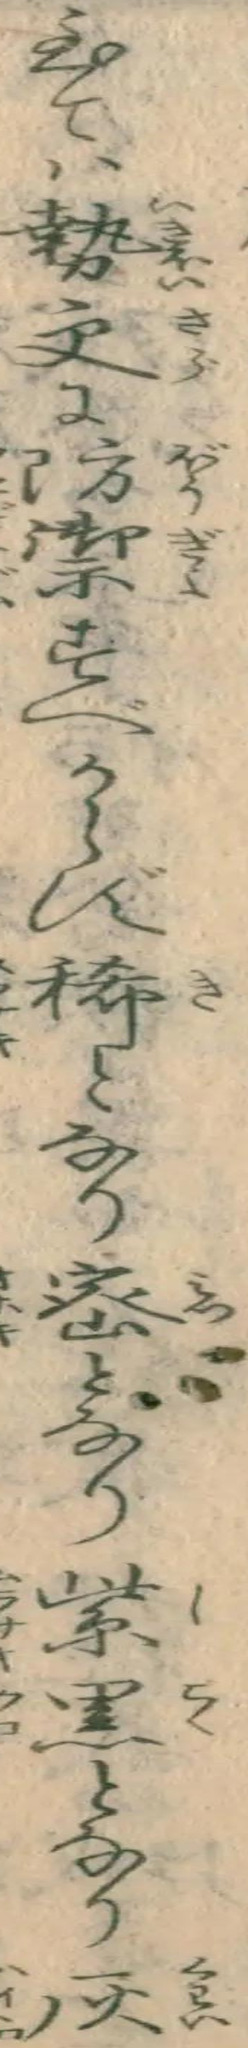至ては勢更に防禦すべからず稀となり密となり紫黒となり灰
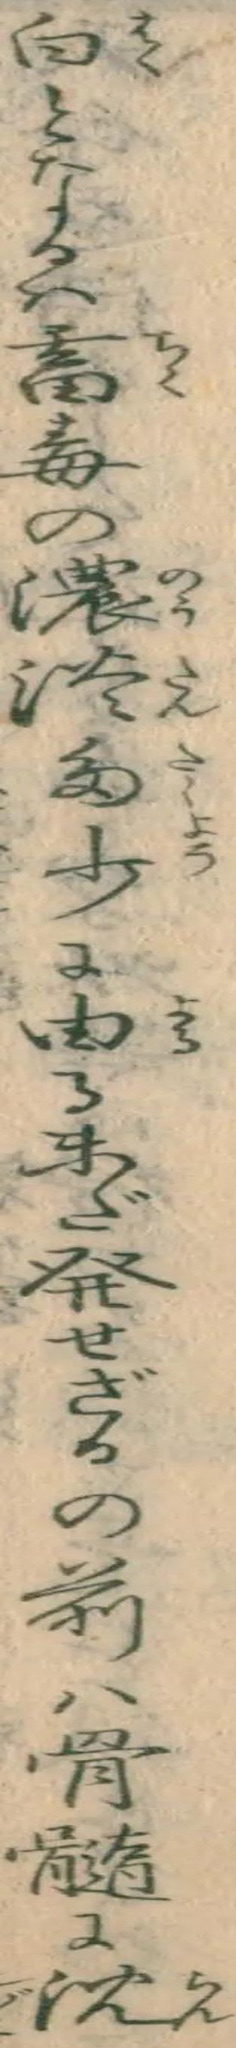白となるは蓄毒の濃淡多少に由未だ発せざるの前は骨髄に沈
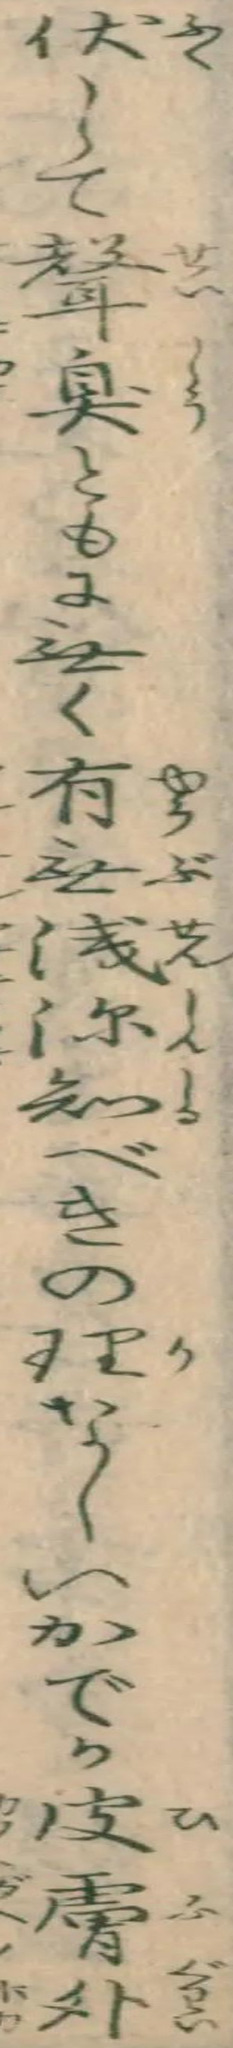伏して聲臭ともに無く有無浅深知べきの理なしいかでか皮膚外
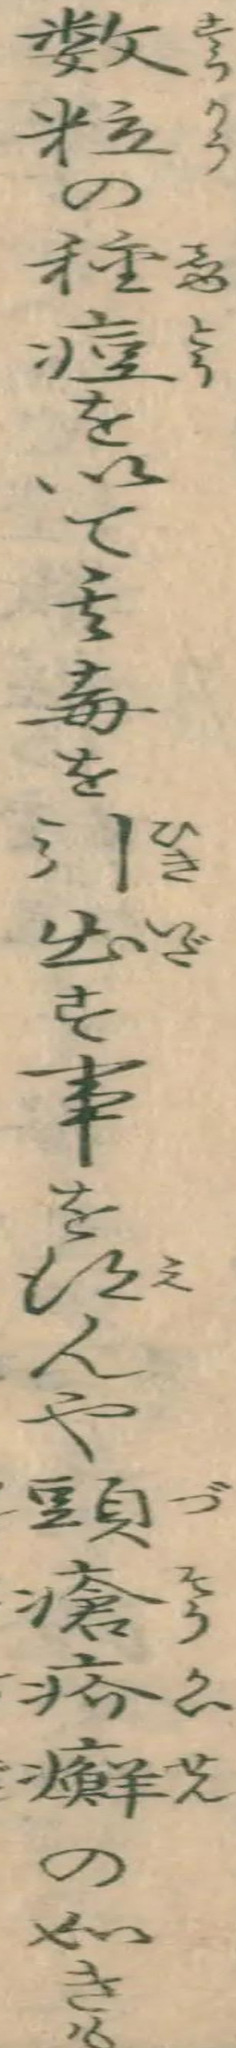数粒の種痘を以て其毒を引出す事を得んや頭瘡疥癬の如きも
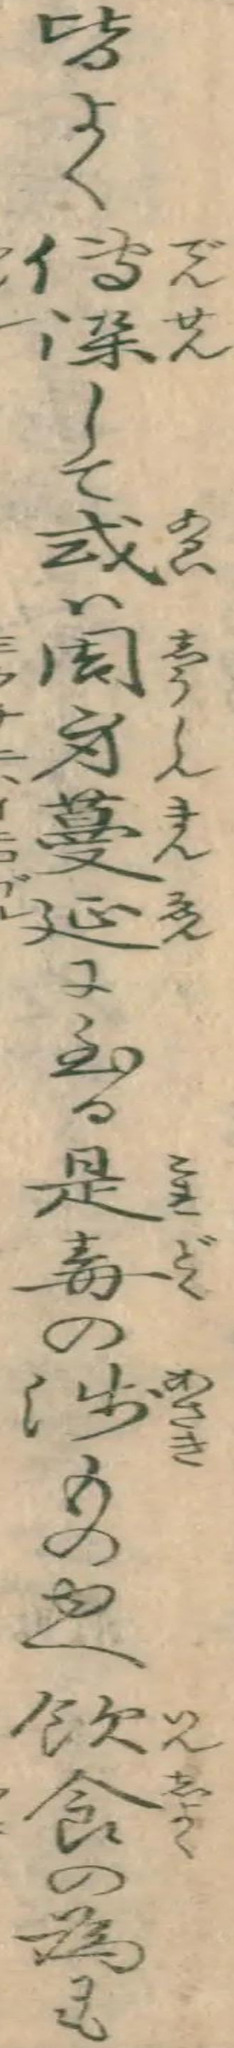皆よく傳染して或は周身蔓延に至る是毒の浅ものゆへ飲食の為も
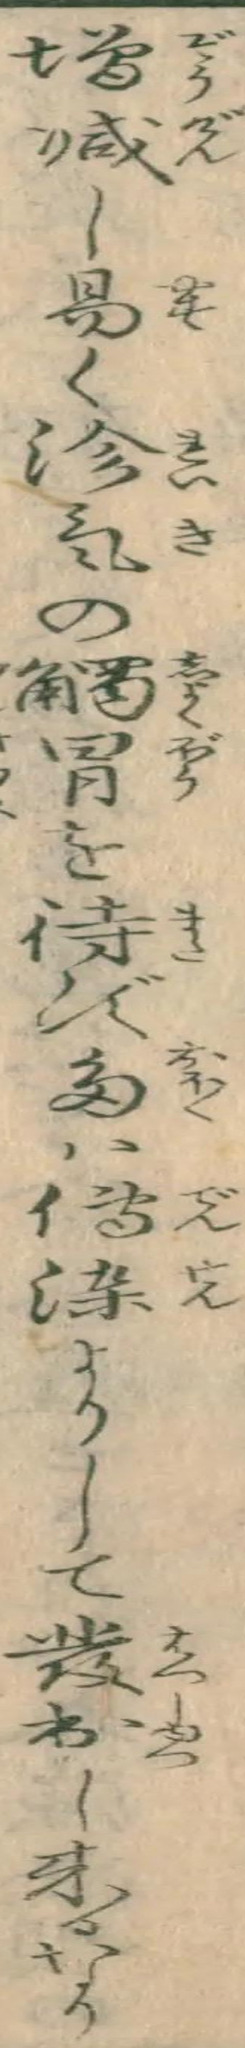増減し易く沴気の觸冒を待ず多は傳染よりして発出し来るなり
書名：牛痘辨非
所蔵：国立国会図書館 National Diet Library, JAPAN
